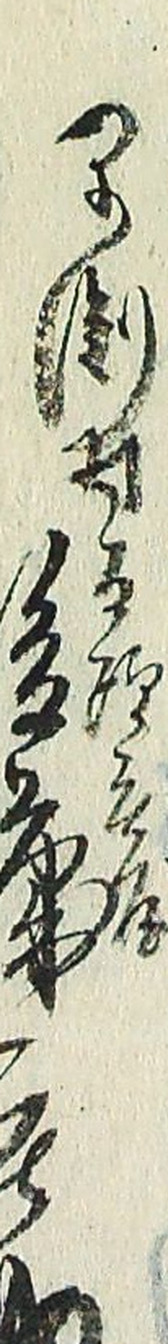早淵村与頭庄屋
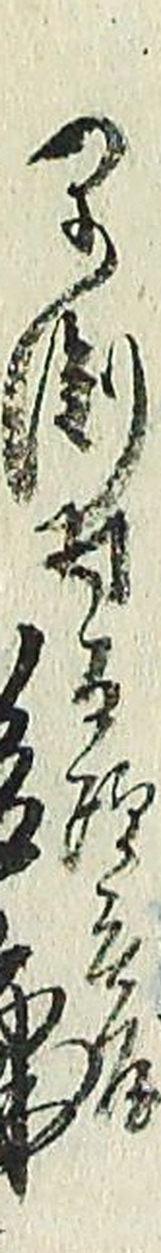早淵村与頭庄屋
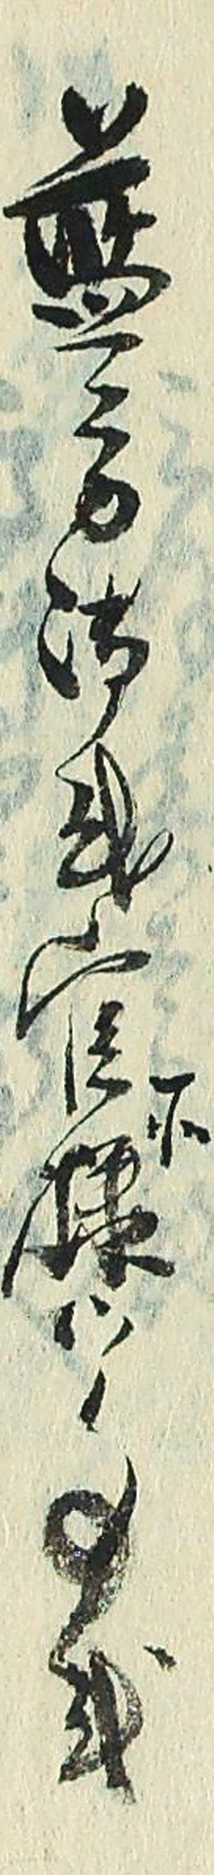藍方御代官所様御手代
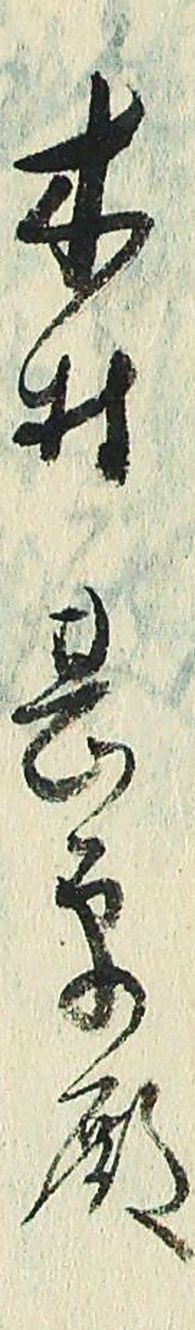木村甚平殿
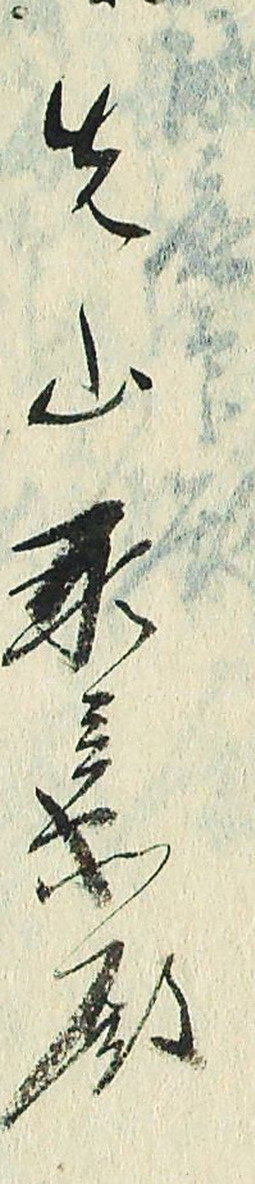先山形兵衛殿

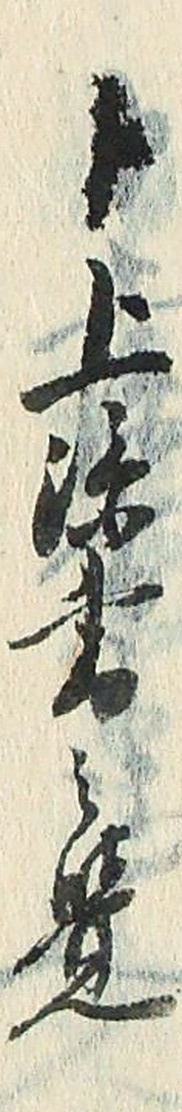申上添書之覚
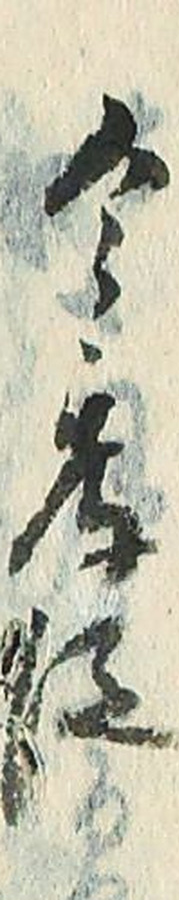今度従
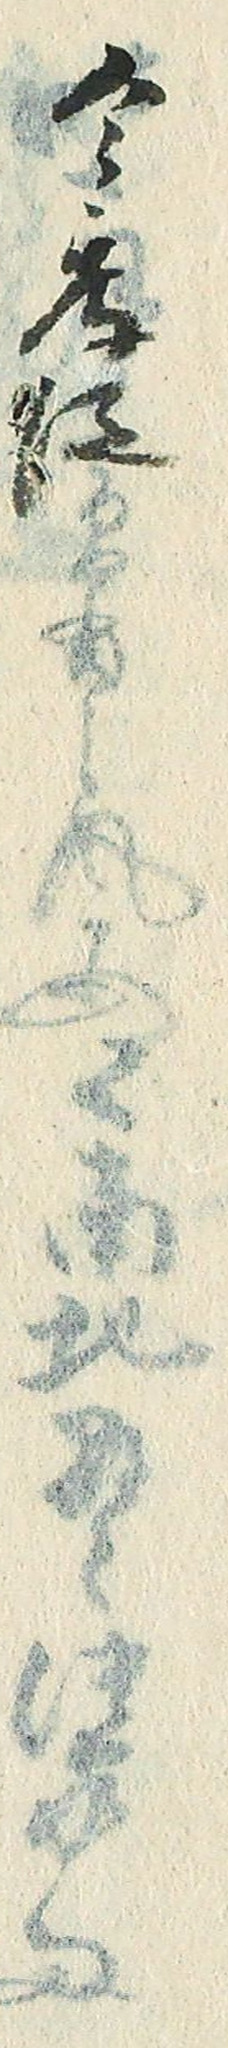今度従
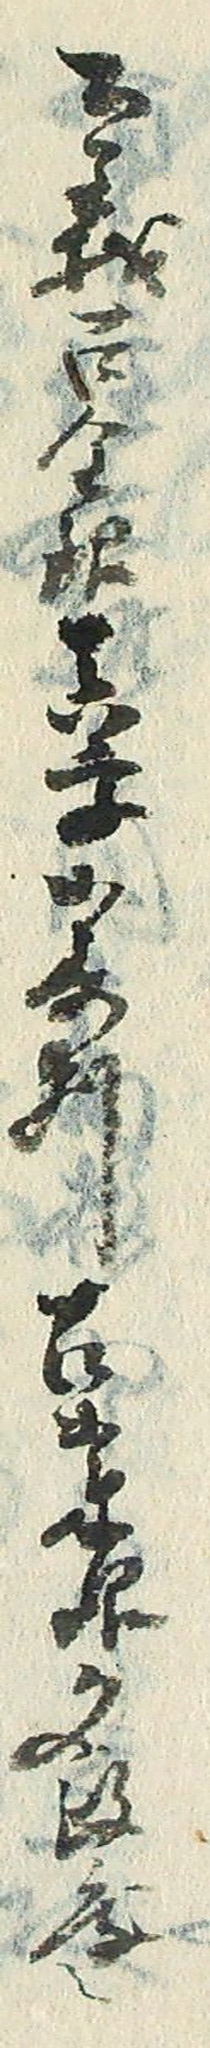公義古金銀真字弐歩判古弐朱銀文政度之
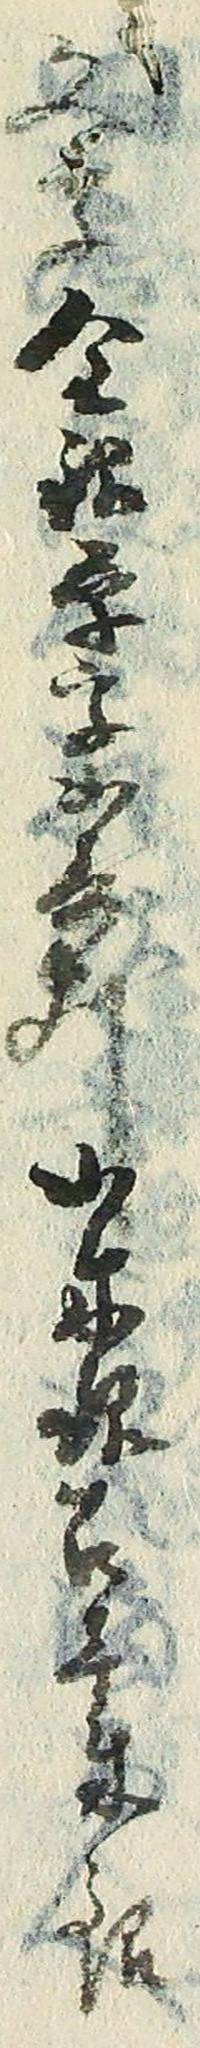文字金銀草字弐歩判弐朱銀古壱朱銀
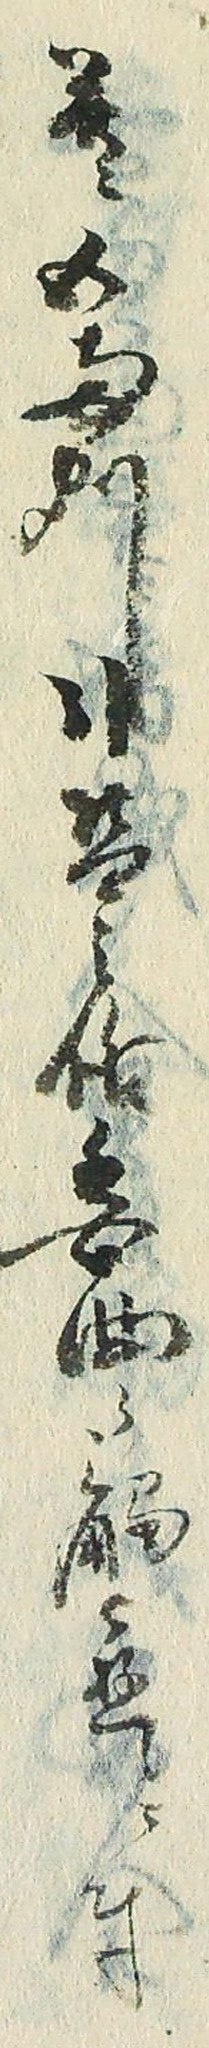幷に五両判引替之儀委曲御触被遊候に付
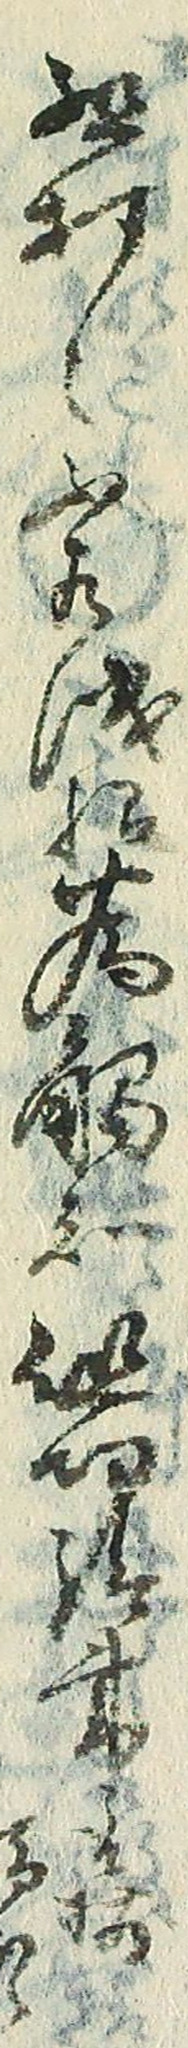組村々不相洩様為触知組切請書取揃指出候様
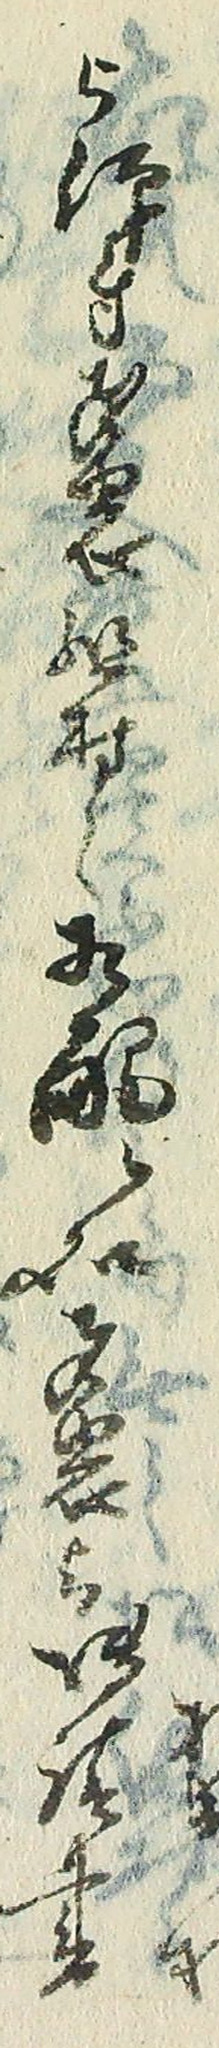被仰付奉畏組村々相触候処奉畏旨御請書
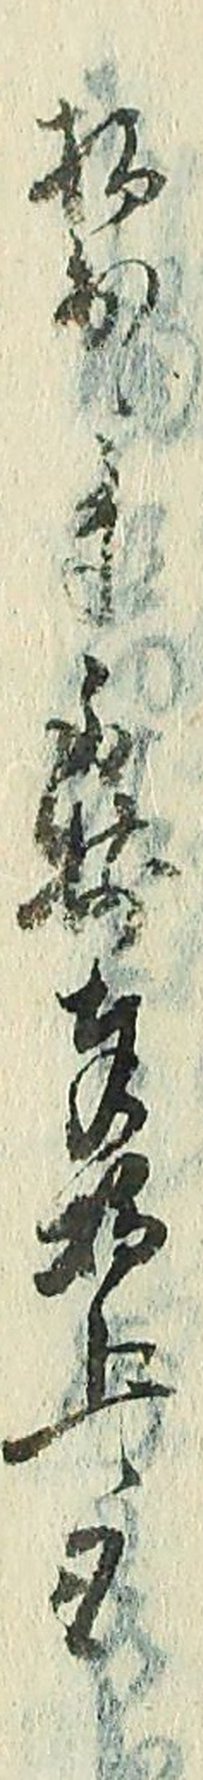指出候に付取揃奉指上候以上
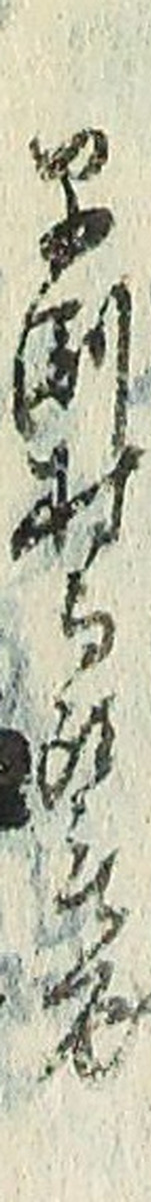早渕村与頭庄屋
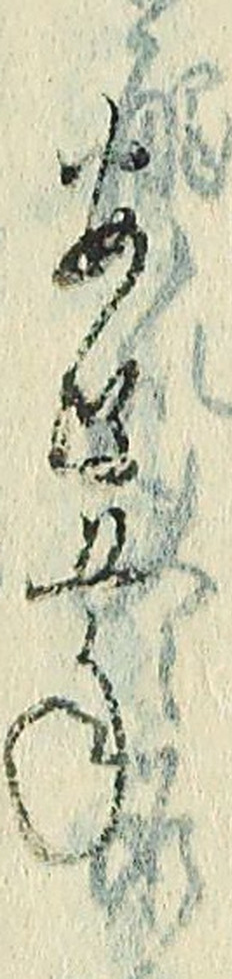安政五年
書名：諸御用御□受書控
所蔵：鳴門教育大学 Naruto University of Education
